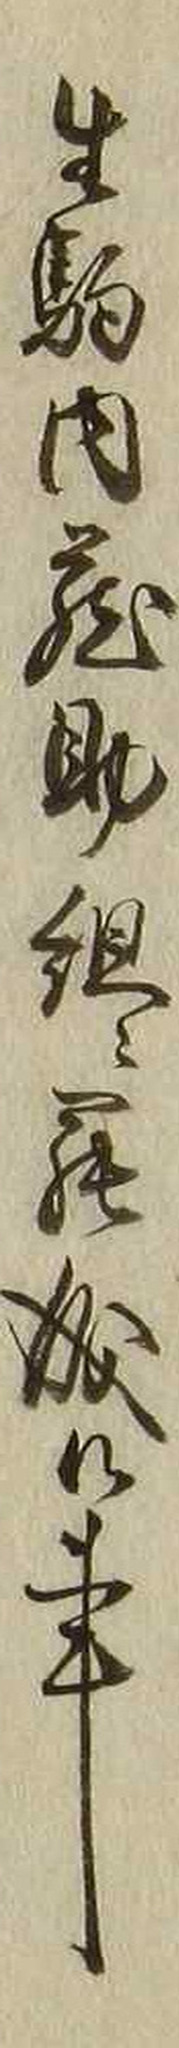生駒内蔵助組ニ罷成候事
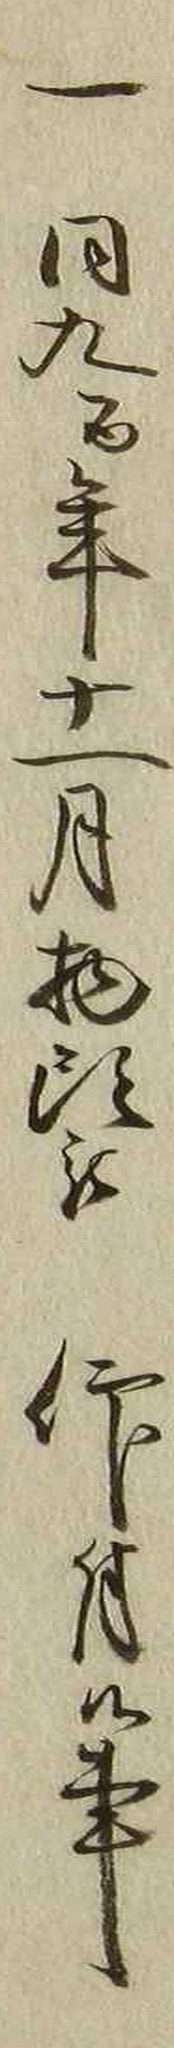一同九酉年十一月物頭被仰付候事
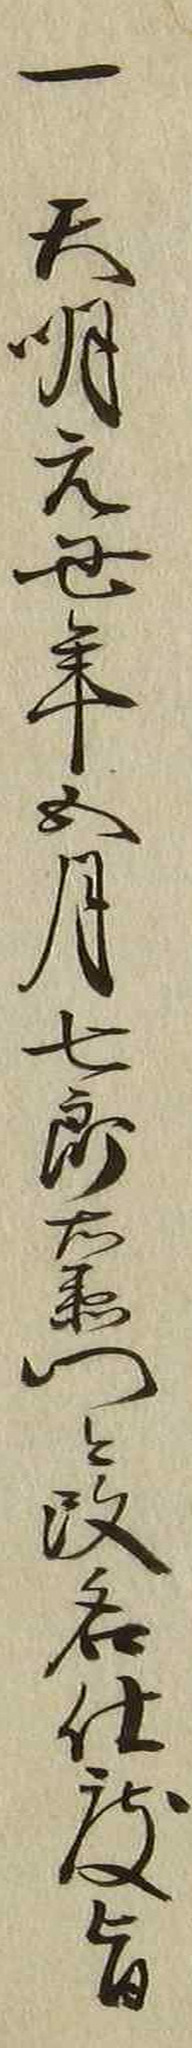一天明元丑年五月七郎右衛門と改名仕度旨
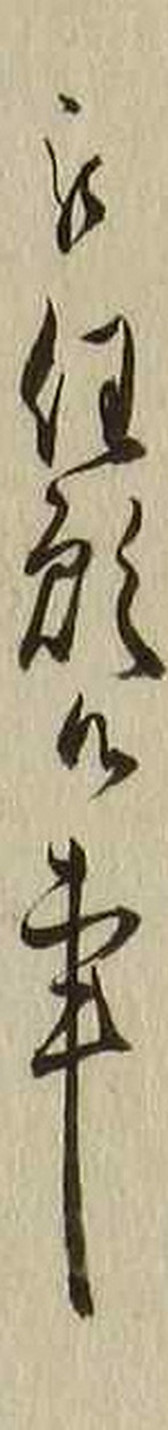被伺願候事
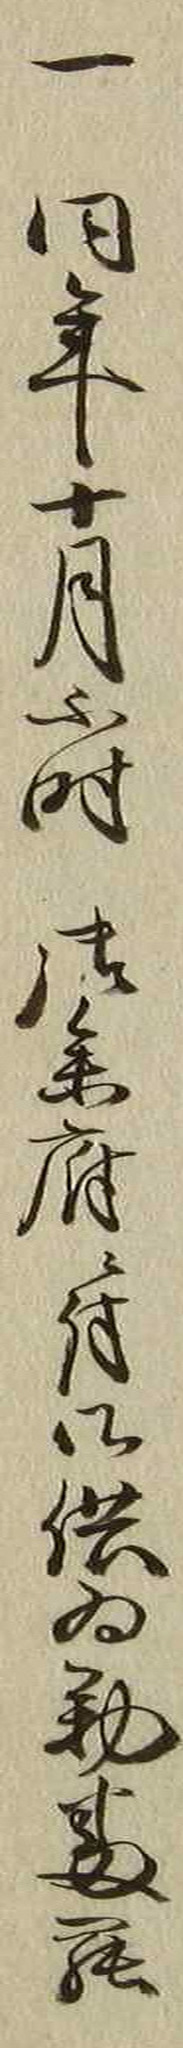一同年十月不時御参府ニ付御供為勤番罷
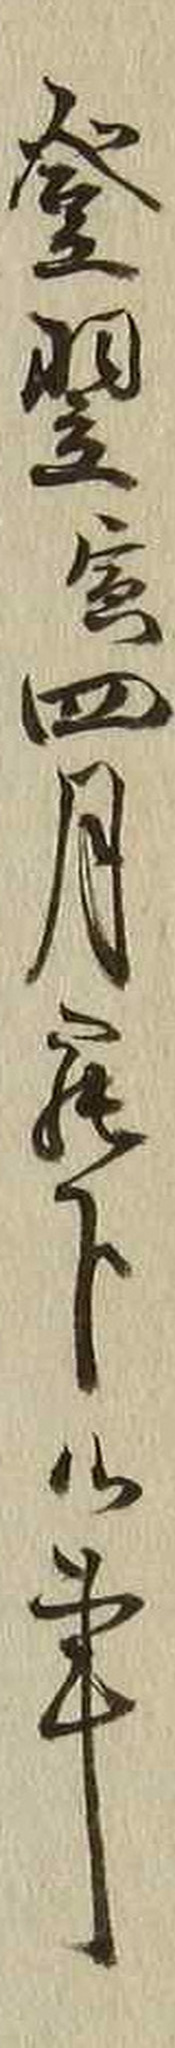登翌寅四月罷下候事
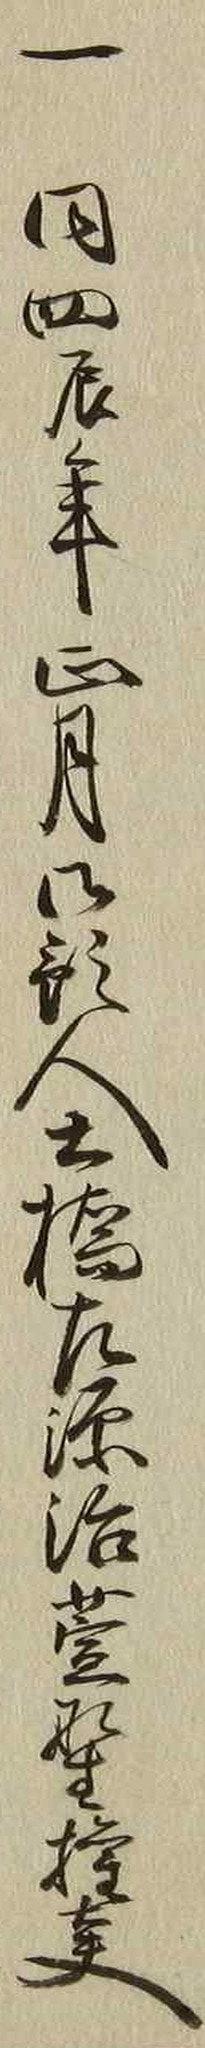一同四辰年正月御預人土橋佐源治萱野権太夫
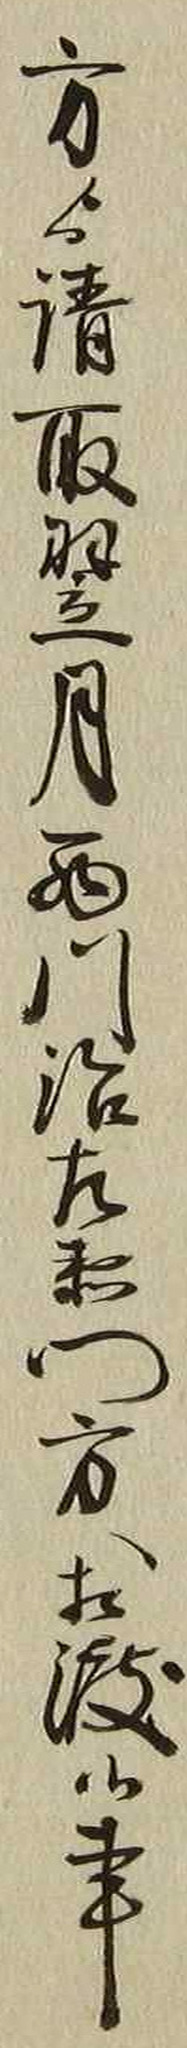方ゟ請取翌月西門治左衛門方ヘ相渡候事
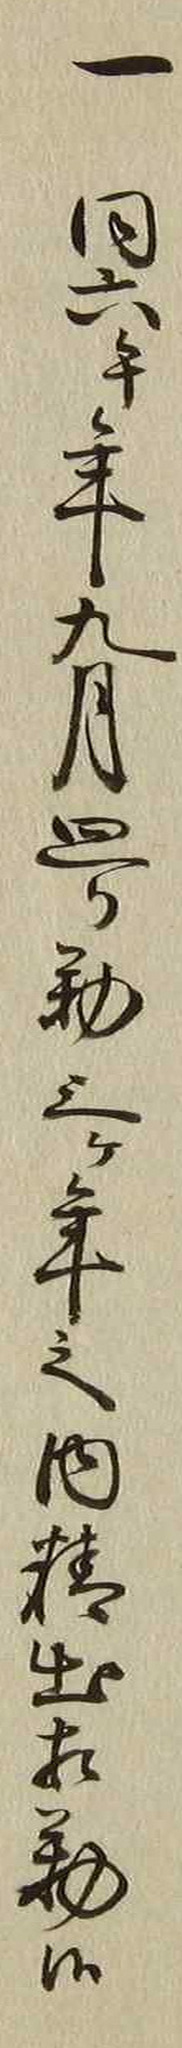一同六午年九月廻り勤三ケ年之内精弟左久忰
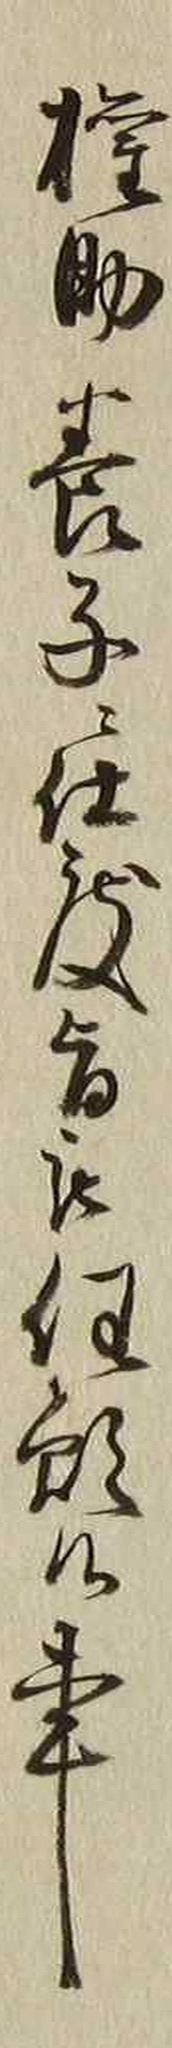権助養子ニ仕度旨被伺願候事
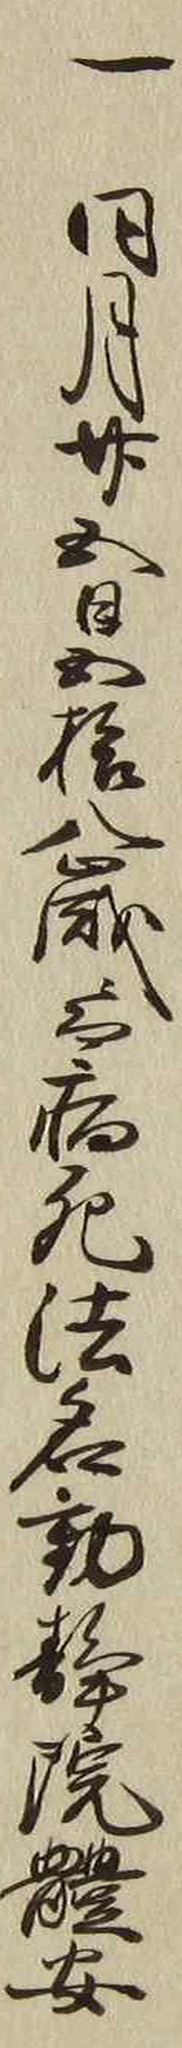一同月廿五日五拾八歳ニ而病死法名動静院體安
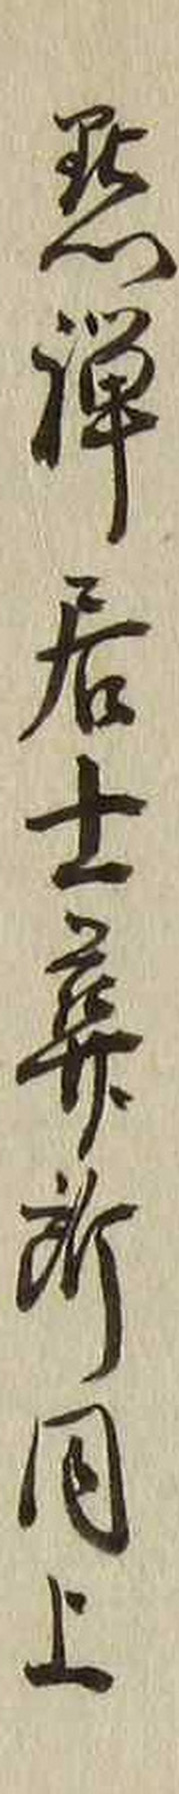懇禅居士葬所同上
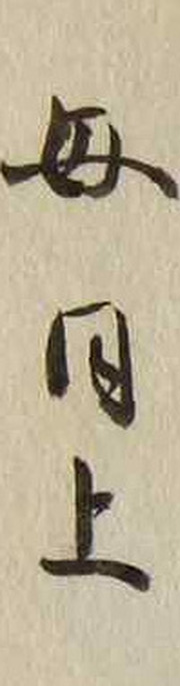母同上

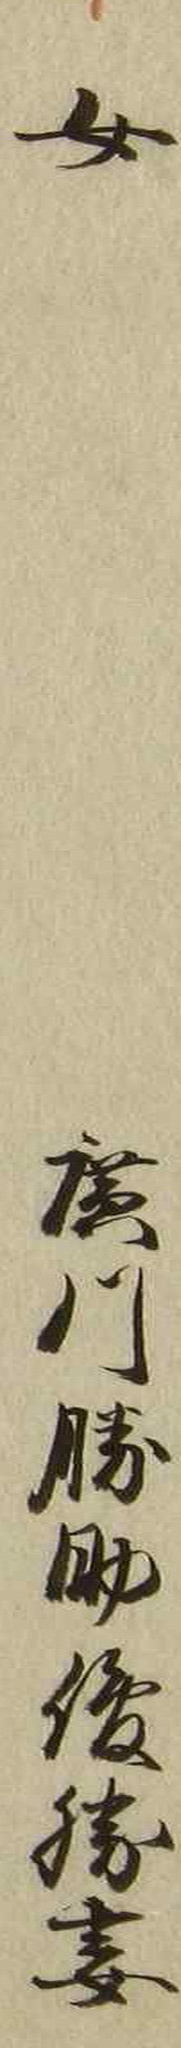女廣門勝助俊勝妻
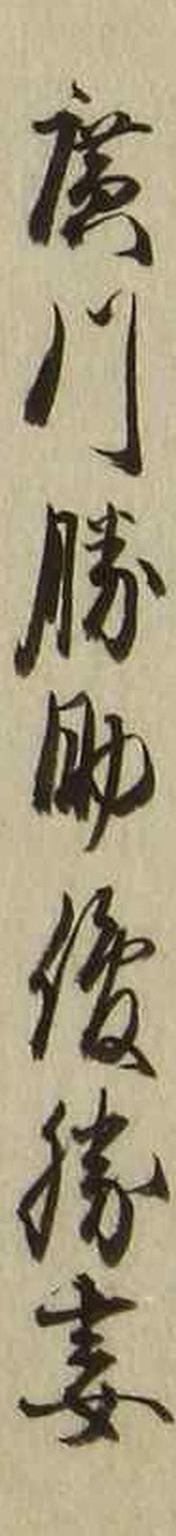女廣門勝助俊勝妻
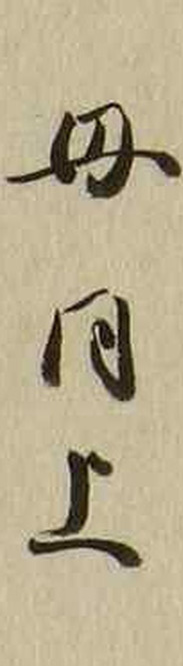母同上
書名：諸士系譜　巻之65　ち之部1
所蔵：会津若松市立会津図書館
